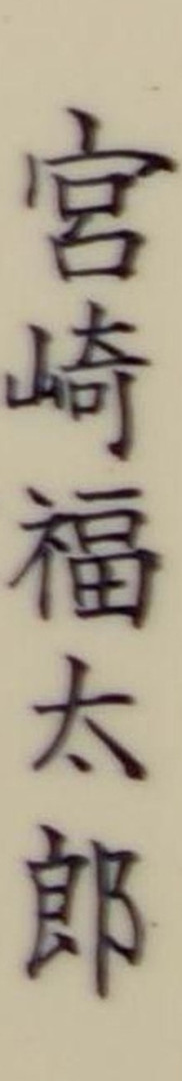宮崎福太郎
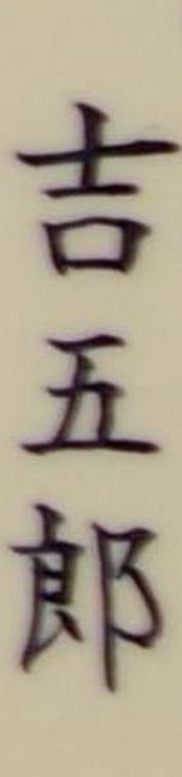吉五郎
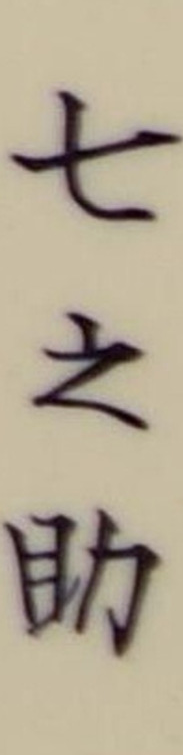七之助
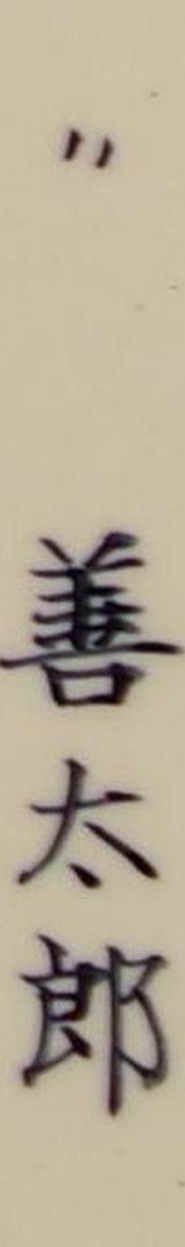善太郎
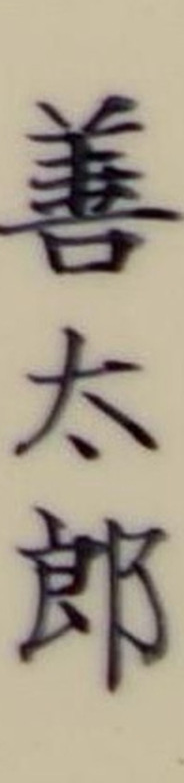善太郎
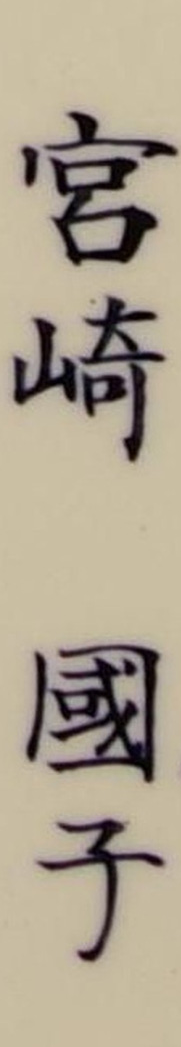宮崎國子
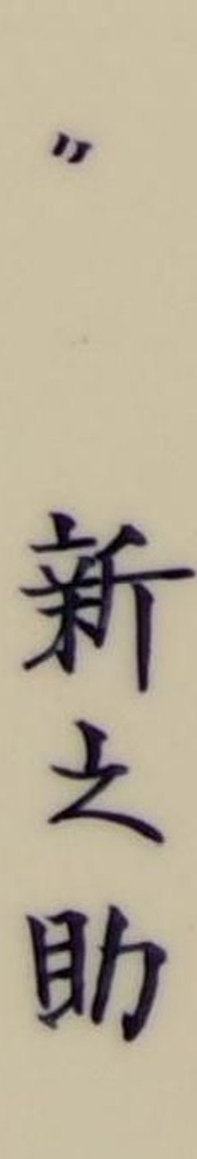新之助
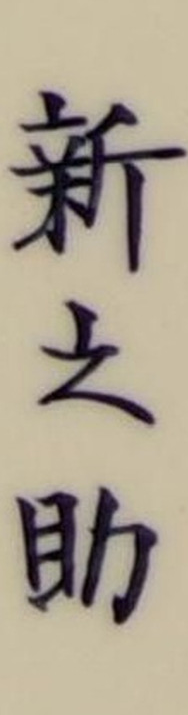新之助
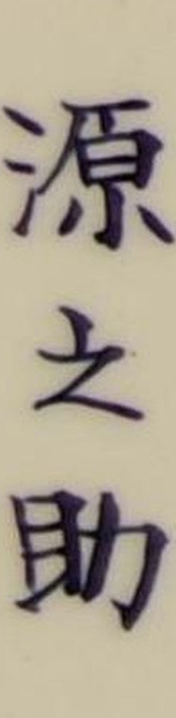源之助
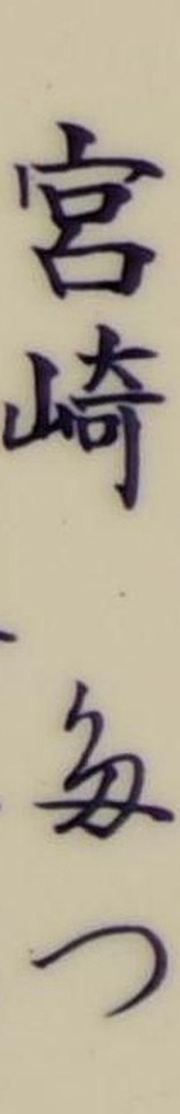宮崎たつ
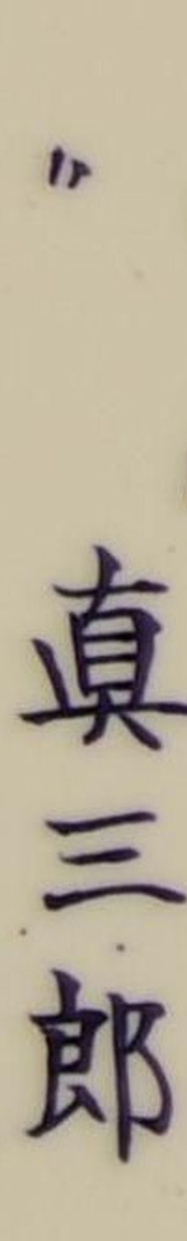真三郎
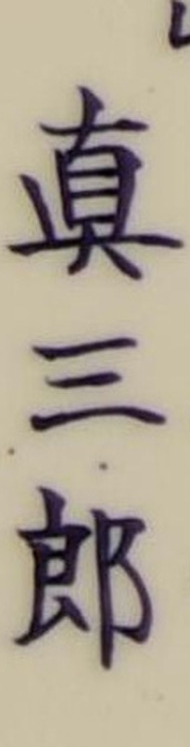真三郎

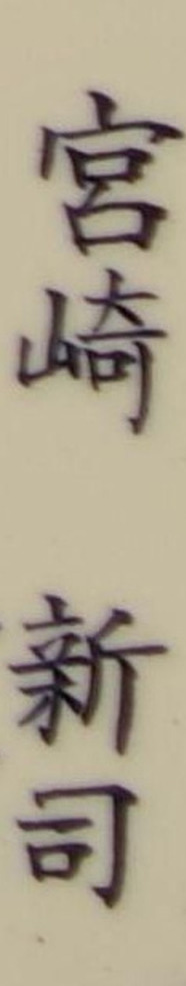宮崎新司
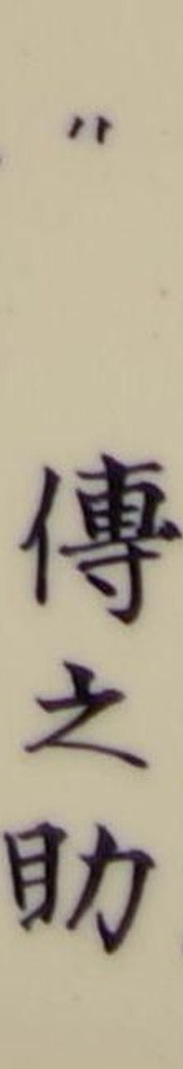傳之助
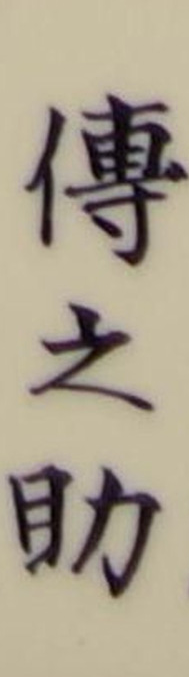傳之助
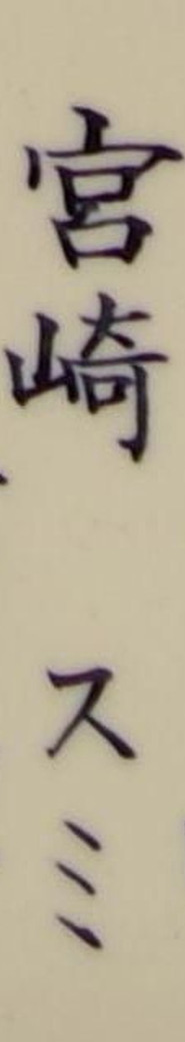宮崎スミ
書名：E~L
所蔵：高野山金剛峯寺
